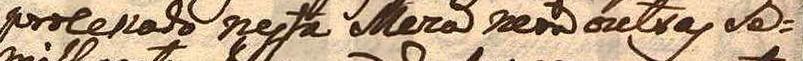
processado nesta Meza nem outras se
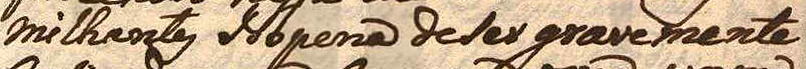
milhantes sob pena de ser gravemente
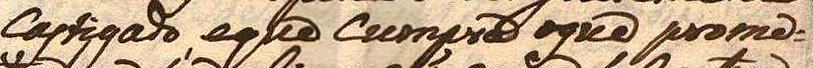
Castigado e que cumpra o que prome
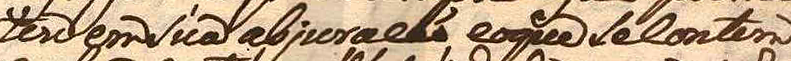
teu em sua abjuraçaõ, e o que se contem
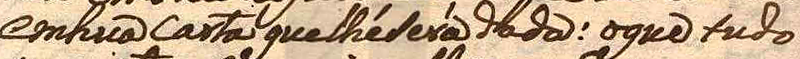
em huā carta, que lhe será dada: o que tudo
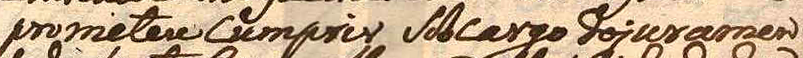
prometeu cumprir sob cargo do juramen
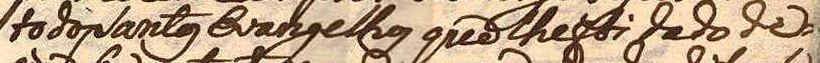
to dos santos Evangelhos que lhe foi dado de
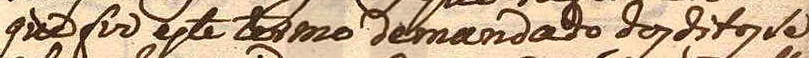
que fiz este termo de mandado dos ditos se
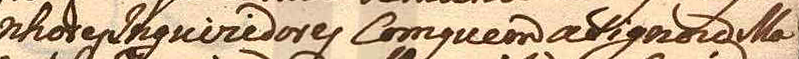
nhores Inquizidores Com quem asignou Ma
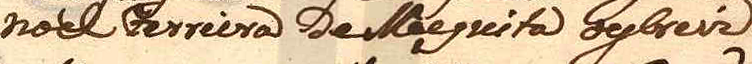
noel Ferreira de Meequita o esCrevi
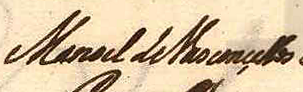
Manoel de Vasconçellos
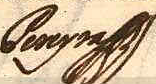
Pereyra
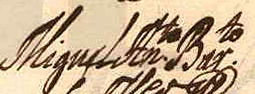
Miguel An.to Bar.to
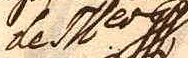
de M.co
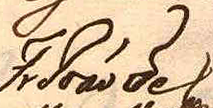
Fr Ioaõ de
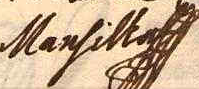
Mansilha
